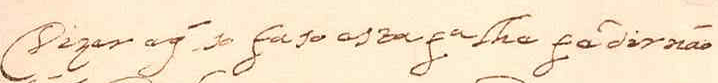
Dizer a q̄ so faso esta pa lhe pedir não
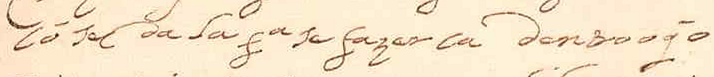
c̄oseda la fa se fazer ca dentro o q̄ o
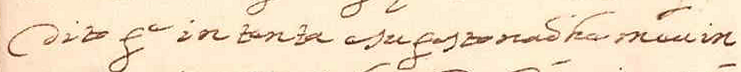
dito pe intenta e suposto naõ he meu in
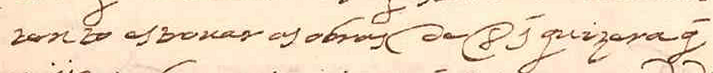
tento estrouar as obras de Ds̄ quizera q̄
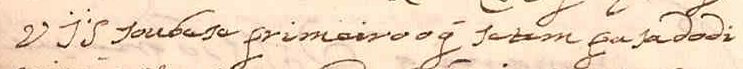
V J.S soubese primeiro o q̄ se tem pasado di
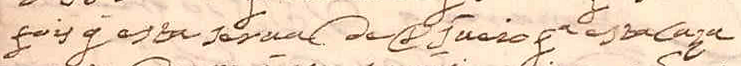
pois q̄ esta serua de Ds̄ ueio pa esta caza
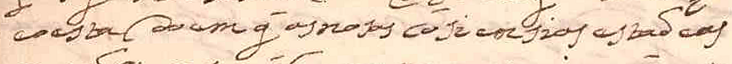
e estado em q̄ as nosas cōsiensias estaõ e as
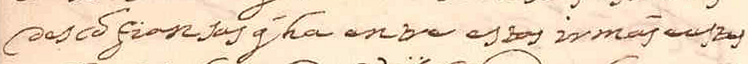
descōfiansas q̄ ha entre estas irmās e estes
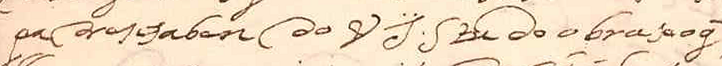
padres sabendo V J.S. tudo obrase o q̄
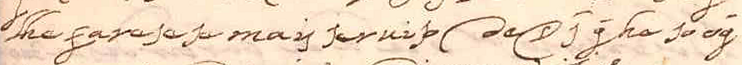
lhe paresese mais seruiso de Ds̄ q̄ he so o q̄
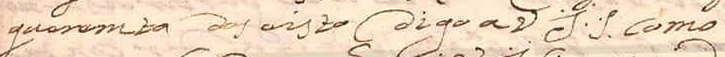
querem todas e isto digo a V J.S. como
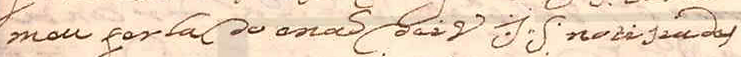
meu perlado e naõ dei V J.S. notisia des
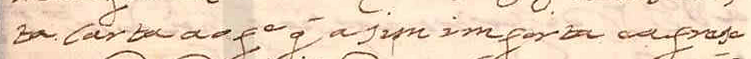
ta carta ao pe q̄ asim importa e aprese
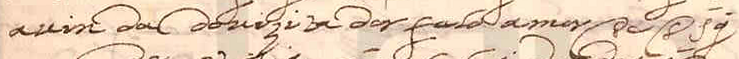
a uinda do uizitador pelo amor de Ds̄ q̄
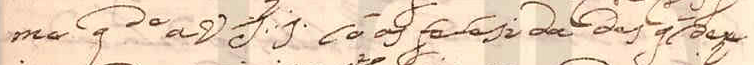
me gde a V. J.S. cō as felesidades q̄ deze
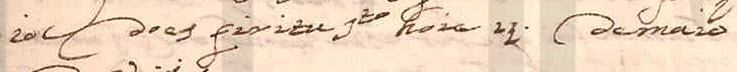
io do espiritu sto hoie 23. de maio
